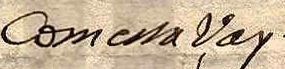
com esta Vay.
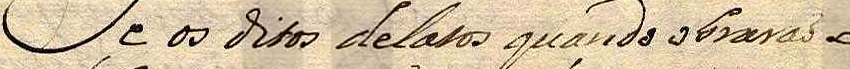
Se os ditos delatos quando obraraõ o
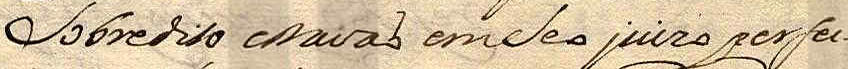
sobredito estavaõ em seo juizo perfei
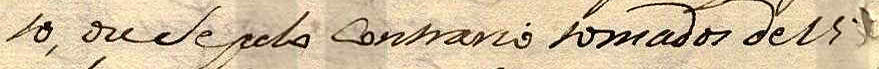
to, ou se pelo contrario tomados de Vi
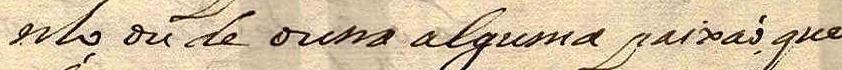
nho, ou de outra alguma paixaõ que
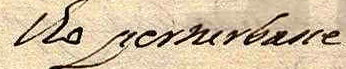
lho perturbasse.
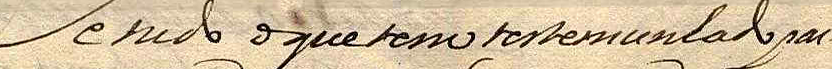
Se tudo o que tem testemunhado pas
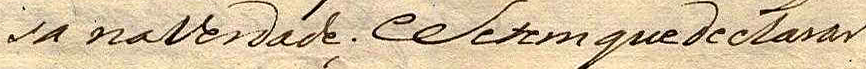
sa na Verdade. e se tem que declarar
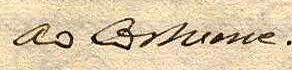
ao costume.
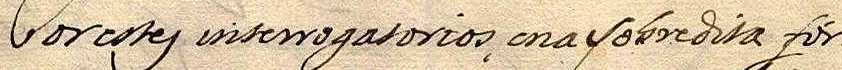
Por estes interrogatorios, e na sobredita fór
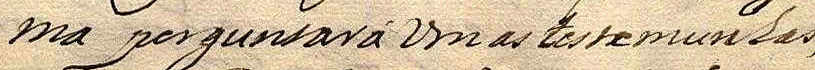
ma perguntará Vm as testemunhas,
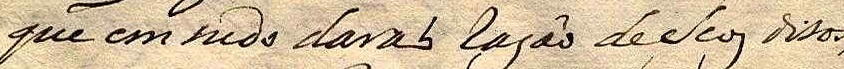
que em tudo daraõ Razaõ de seos ditos,
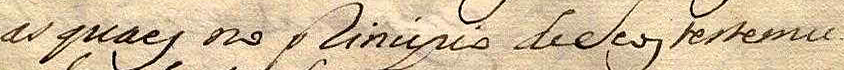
as quaes no principio de seos testemu
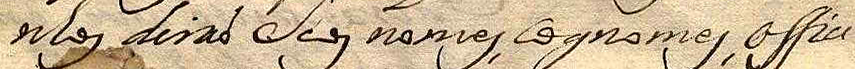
nhos diraõ seos nomes, cognomes, offici
